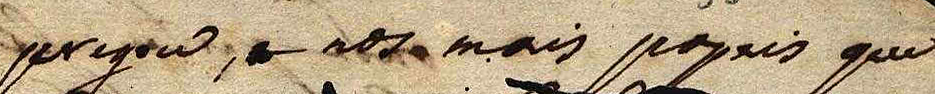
pregou, e nos mais papeis que
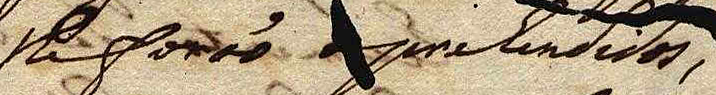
lhe foraõ aprehendidos,
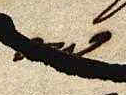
_
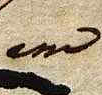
em
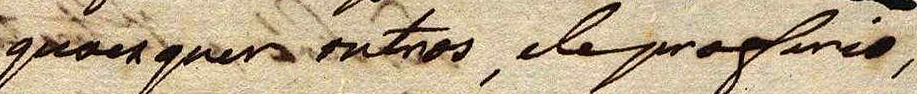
quaesquer outros, ele proferio,
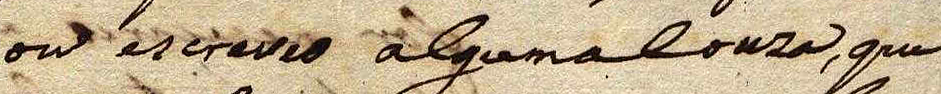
ou escreveo alguma Couza, que
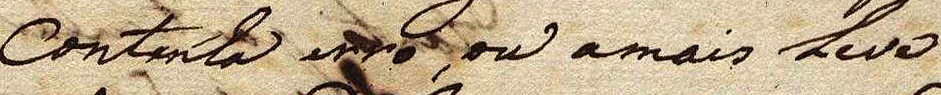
Contenha erro, ou a mais Leve
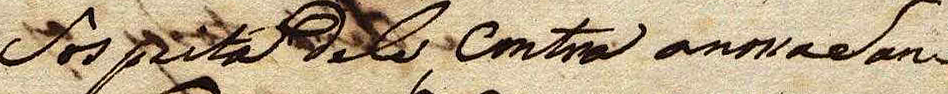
Sospeita dele Contra a nossa San
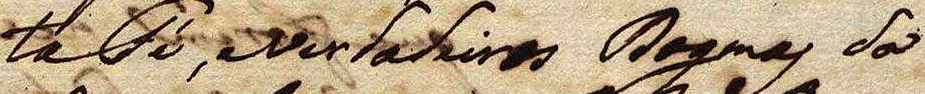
ta Fé, e verdadeiros Dogmas da
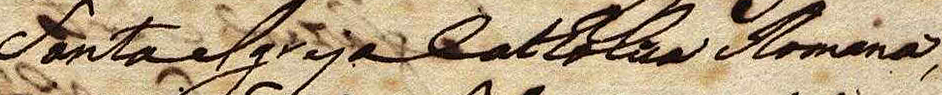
Santa Igreja Catholica Romana,
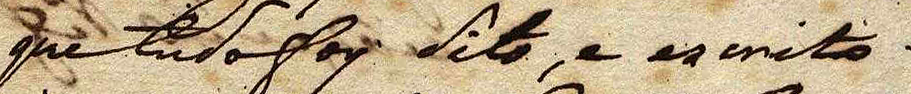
que tudo foy dito, e escrito -
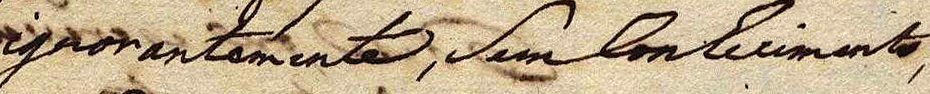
ignorantemente, Sem Conhecimento,
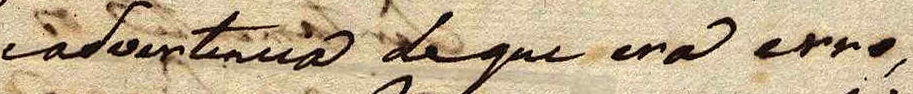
e advertencia de que era erro,
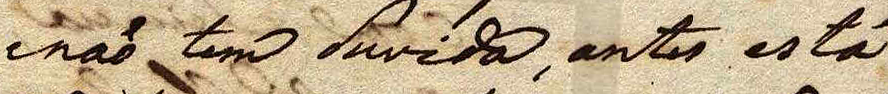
e naõ tem duvida, antes está
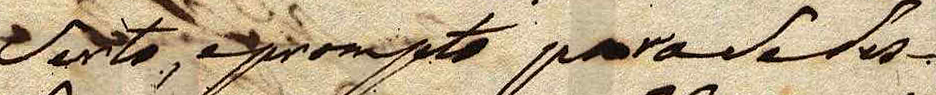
Serto, e prompto para Se des
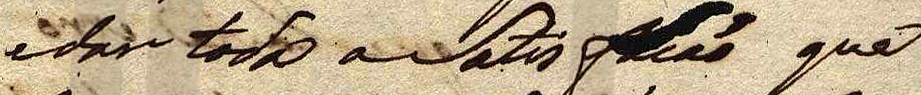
e dar toda a Satisfaçaõ que
